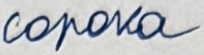сорока
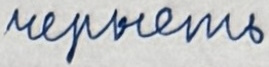чернеть
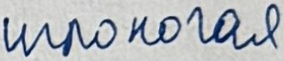иглоногая
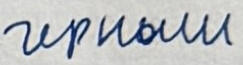черныш
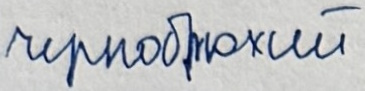чернобрюхий
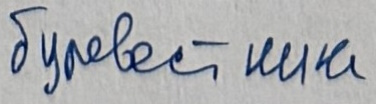булевестник
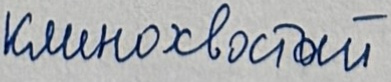клинохвостый
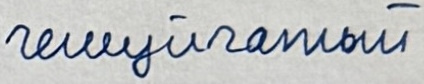чешуйчатый
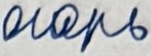огарь
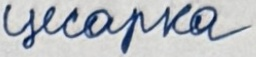цесарка
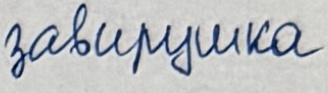завирушка
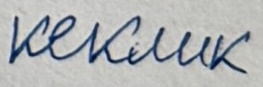кеклик
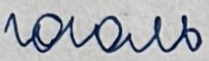гоголь
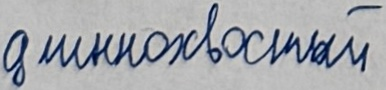длиннохвостый
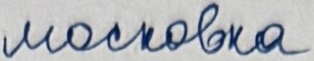московка
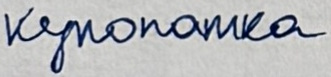купопатка
